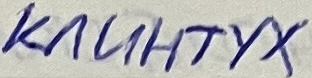клинтух
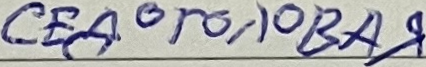седоголовая
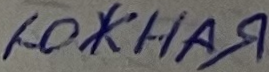южная
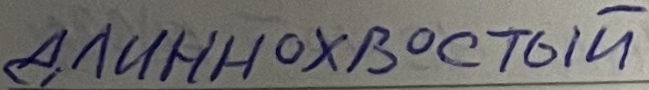длиннохвостый
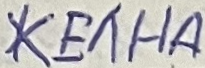желна
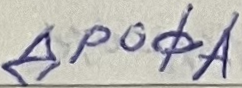дрофа
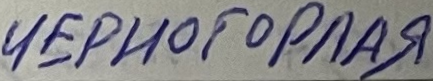черногорлая
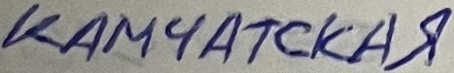камчатская
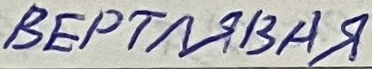вертлявая
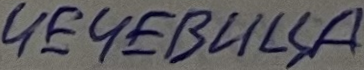чечевица
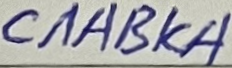славка
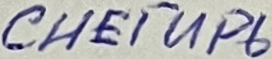снегирь
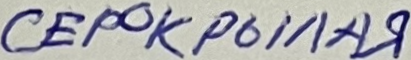серокрылая
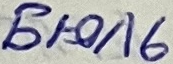бюль
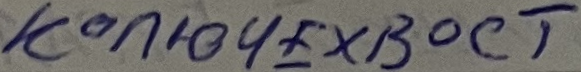колючехвост
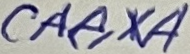саджа
